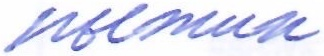пыжик
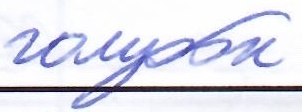голубок
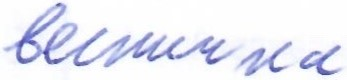весничка
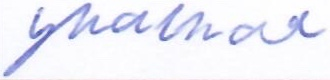упаспая
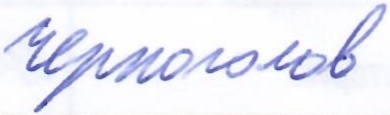черноголов
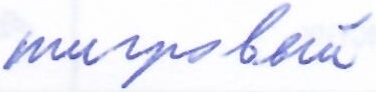тигровый
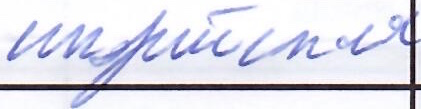инрийская
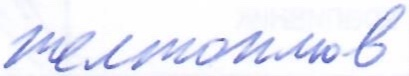желтоклюв
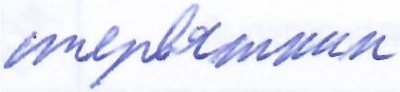стервятник
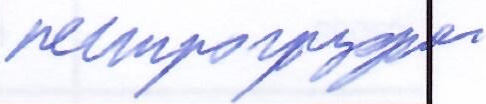пестрогруфа
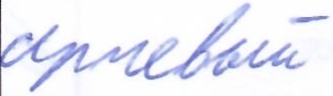арчевый
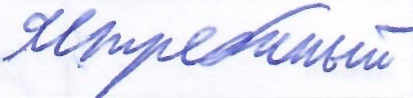ястребиный
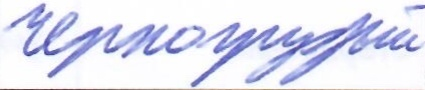черногрудый
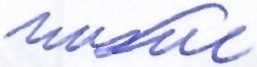чибис
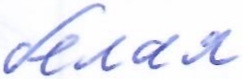белая
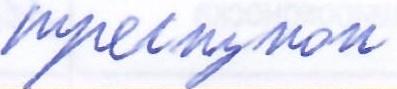трескунок
